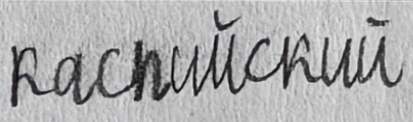каспийский
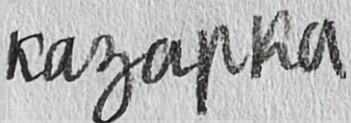казарка
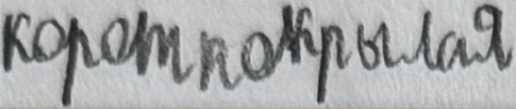короткокрылая
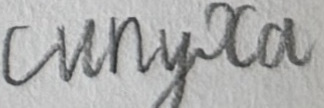сипуха
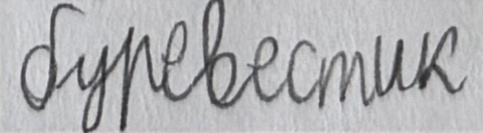буревестик
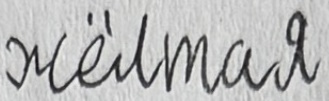жёлтая
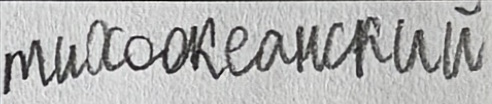тихоокеанский
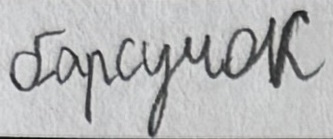барсучок
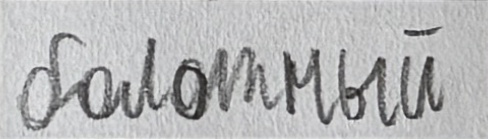болотный
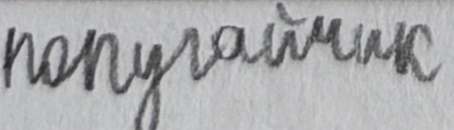попугайчик
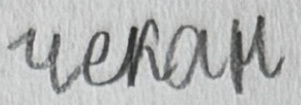чекан
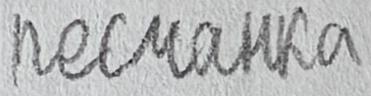песчанка
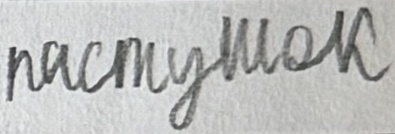пастушок
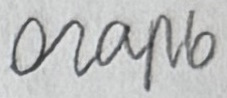огарь
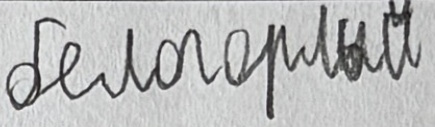белогорлый
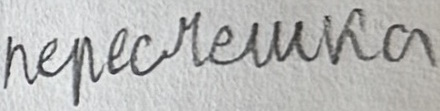пересмешка
